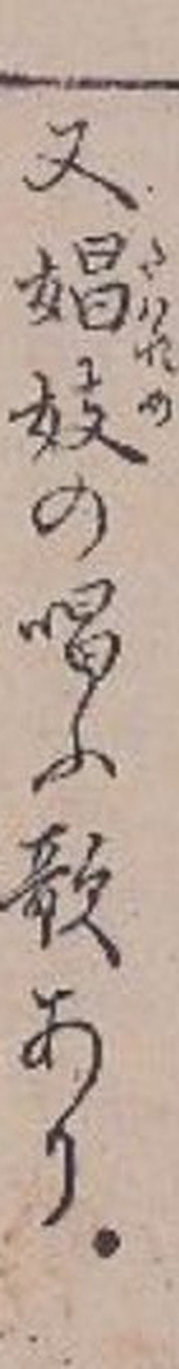又娼妓の唱ふ歌あり、
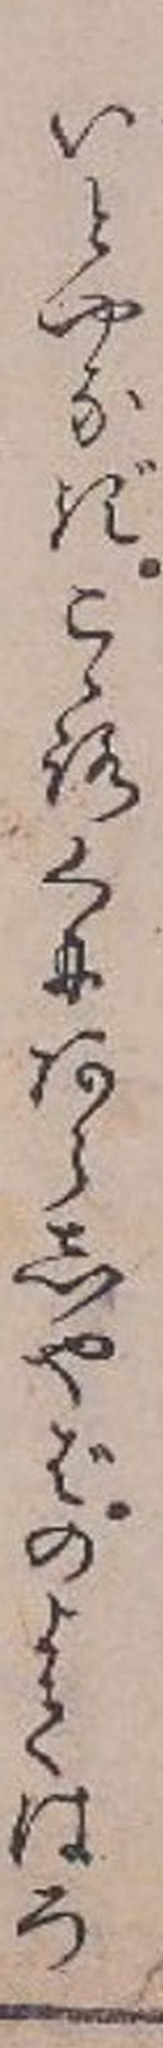いとやなぎ、こゝろくにあらしやば、のよてはろ
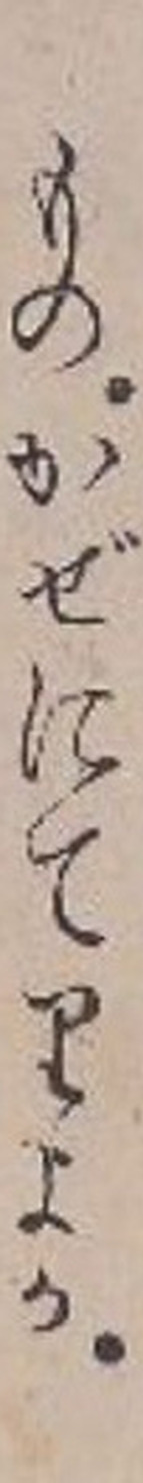もの、かぜにてりよか、
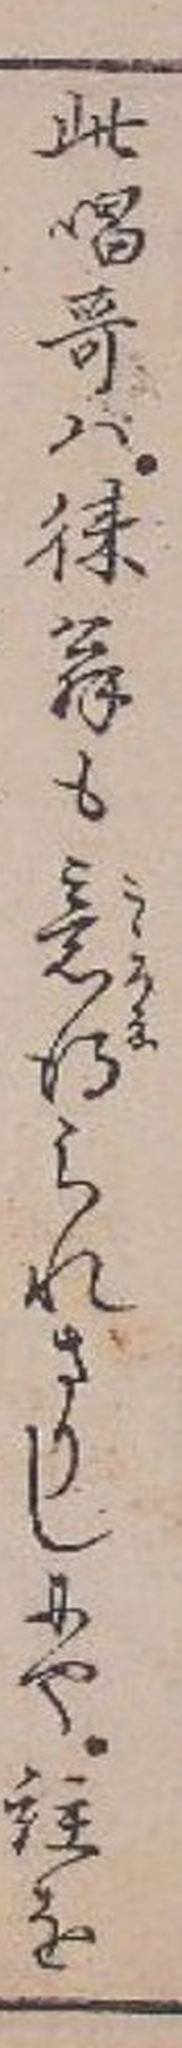此唱哥は、徠翁も意得られさりしにや、註を
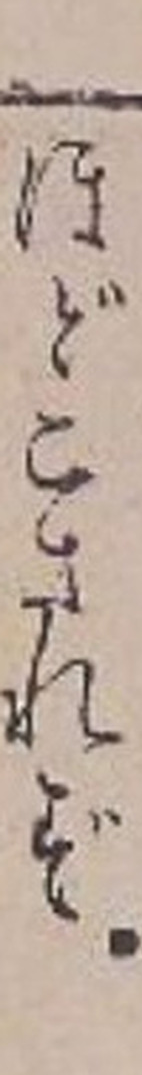ほどこされず、
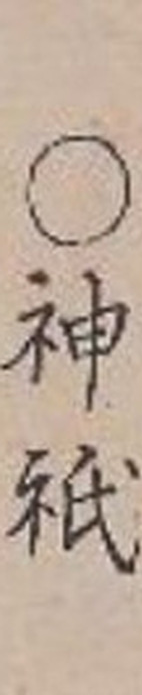〇神祇
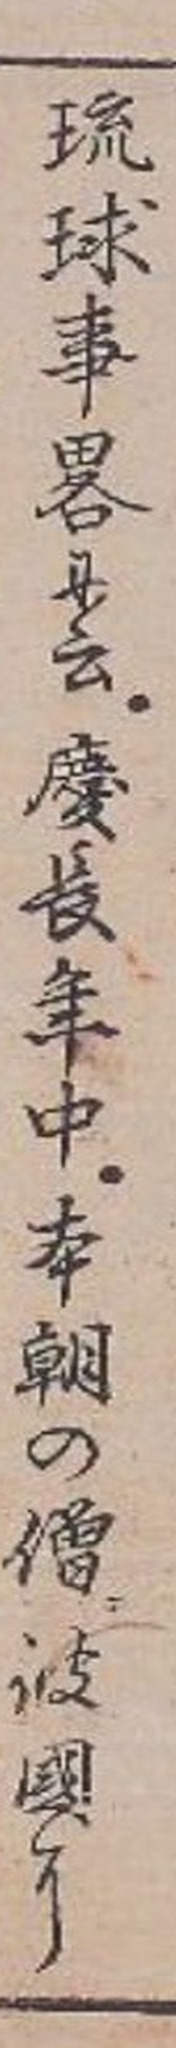琉球事略に云、慶長年中、本朝の僧、彼国に
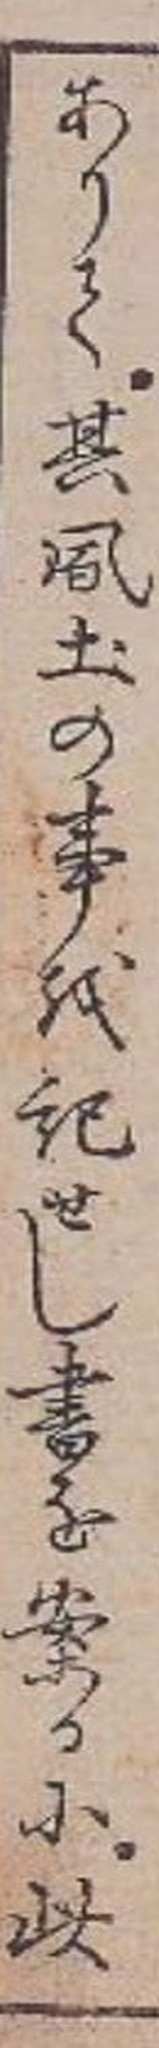ありて、其風土の事を記せし書を案るに、此
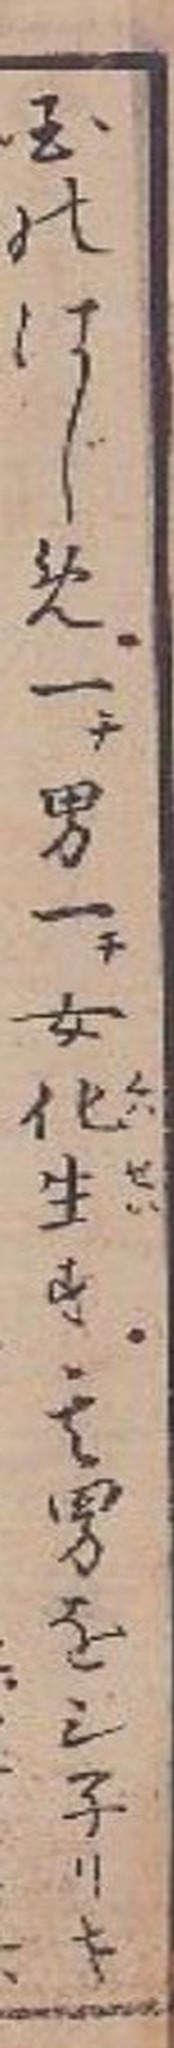国のはじめ、一男一女化生す、其男をシネリキ
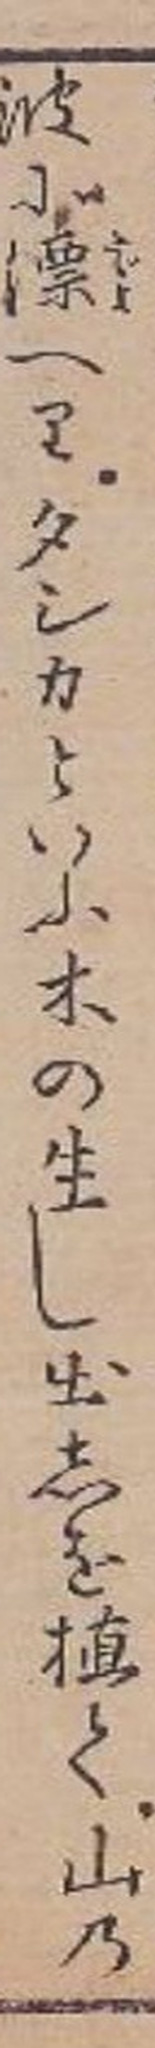波に漂へり、タシカといふ木の生し出しを植て、山の
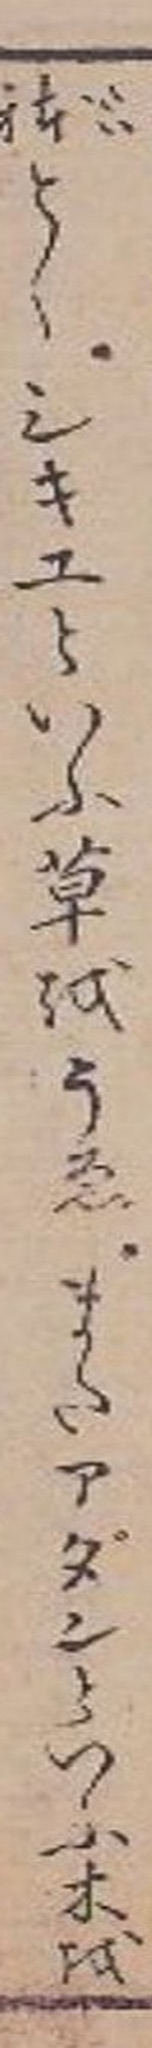体とし、シキユといふ草をうゑ、またアダンといふ木を
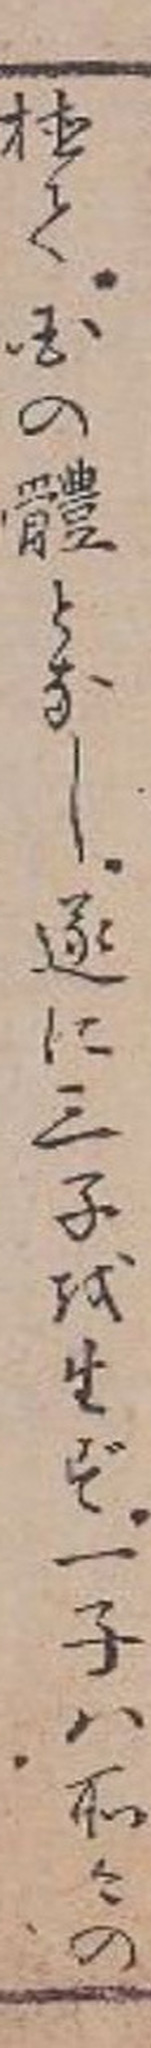植て、国の体となし、遂に三子を生ず、一子は所々の
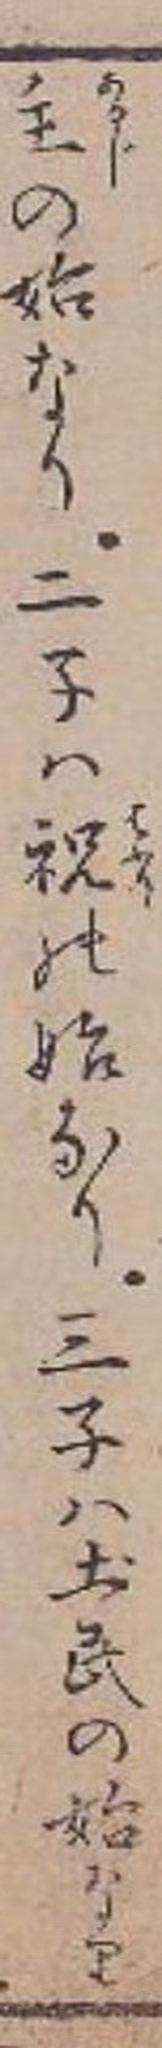主の始なり、二子は祝の始なり、三子は土民の始なり
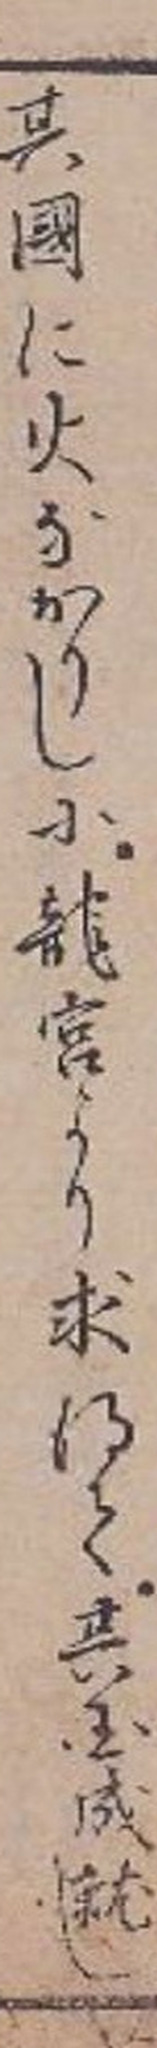其国に火なかりしに、龍宮より求得て、其国成就し、
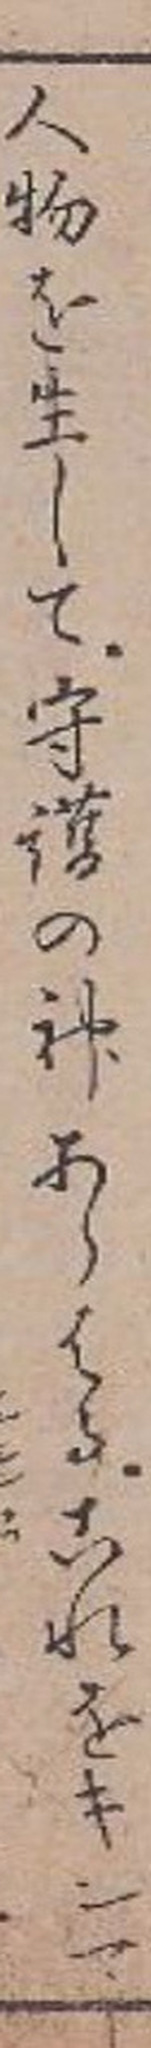人物を生して、守護の神あらはる、これをキンマ

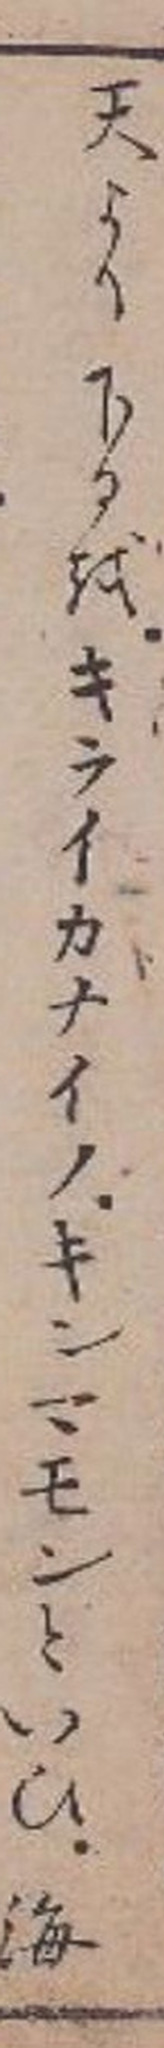天より下るを、キライカナイノ、キンマモンといひ、海
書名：琉球談
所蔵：University of the Ryukyus Library
